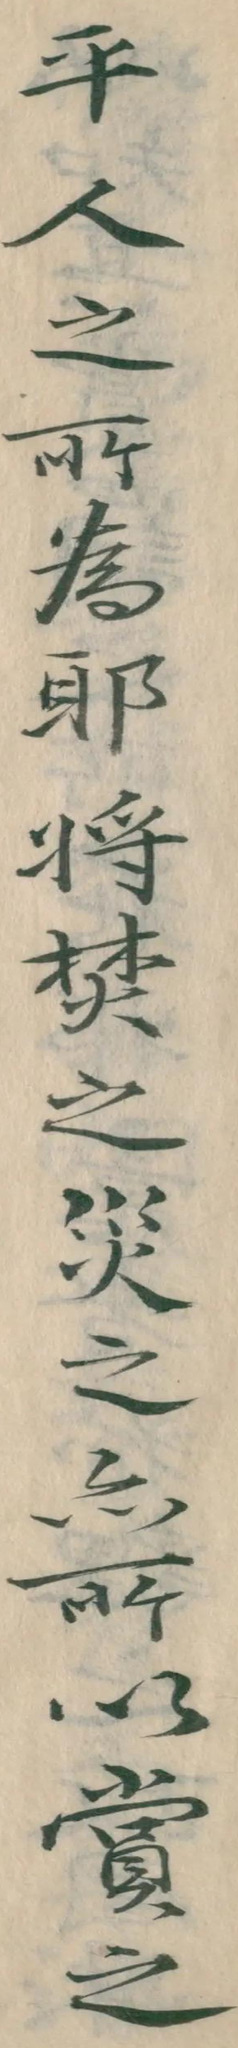平人之所為耶将焚之災之所以賞之

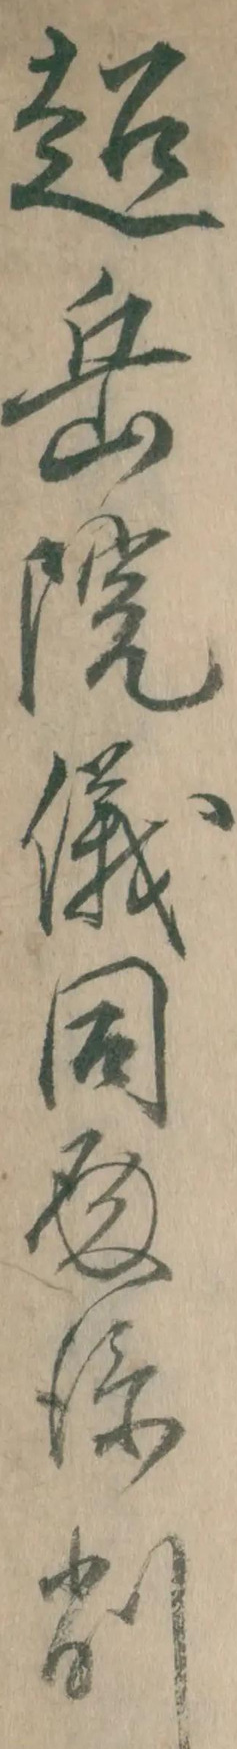超岳院儀同殿添削

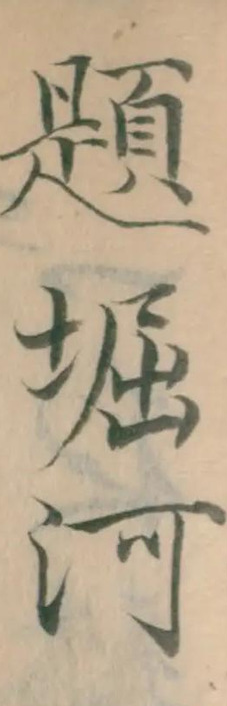題堀河
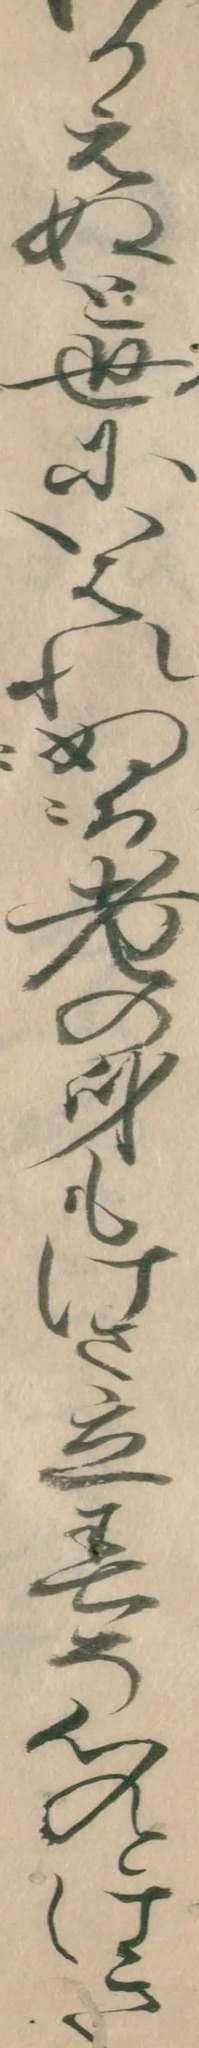〽わかえぬと世・にいはれぬ・か老の身もけさ立春そ心のとけき
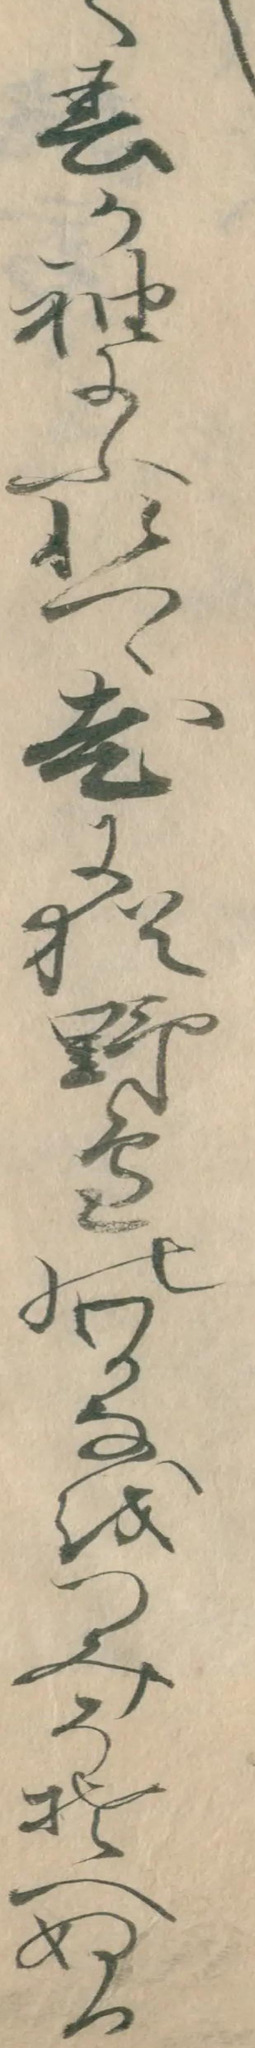〽いく春の袖にふれつゝ老に猶野辺のわかなをつみそそへぬる

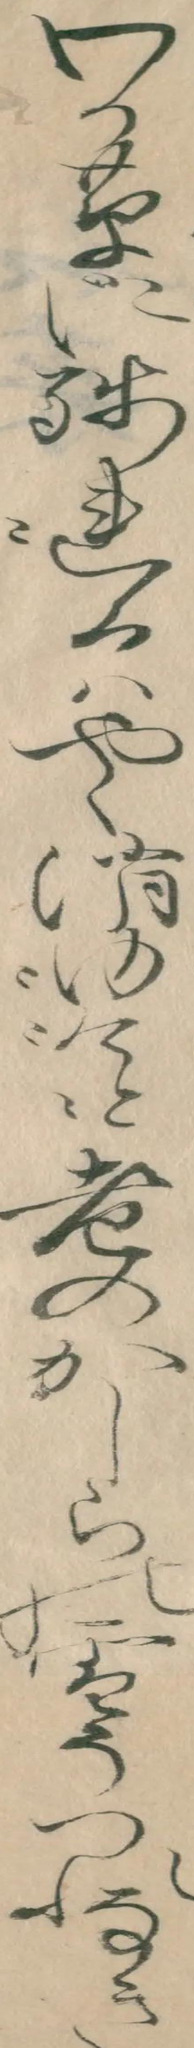〽わか草・に残れるはやく消ゆ今とて老のかしらの雪そつれなき
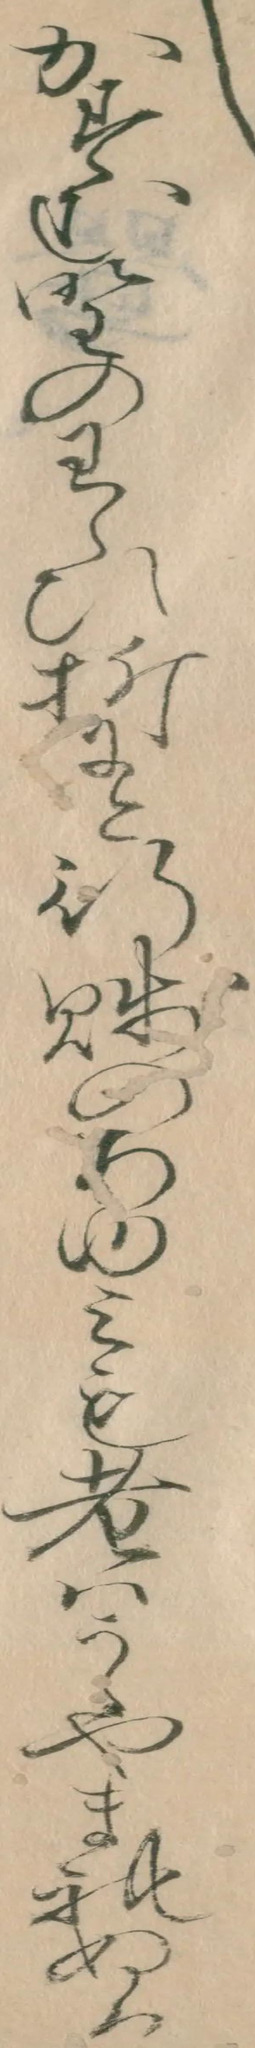〽かすむ野のわらひ折にと行賎のあゆみも老はうらやまれぬる
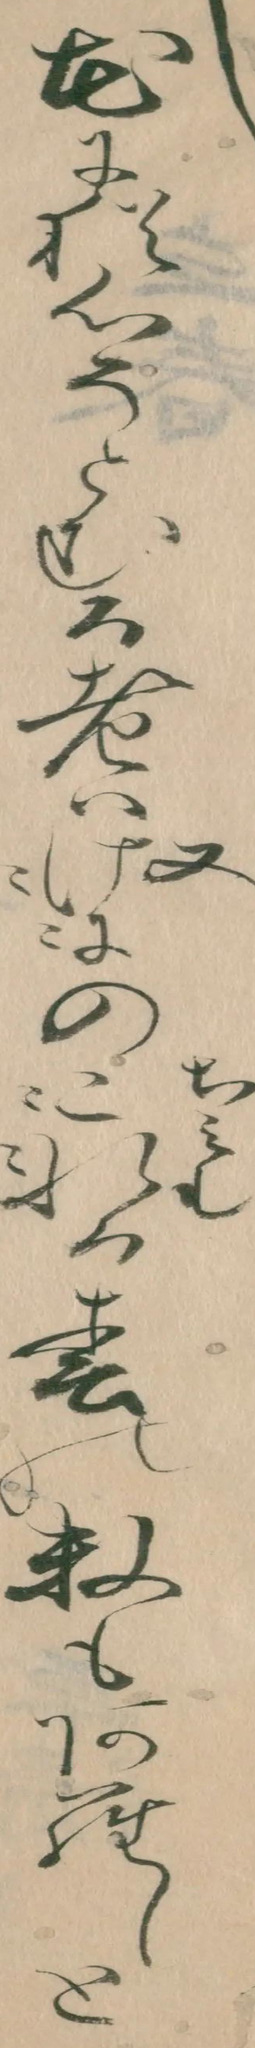〽花に猶心そとむる老いけに又のこれちみむか春の数もあらしと
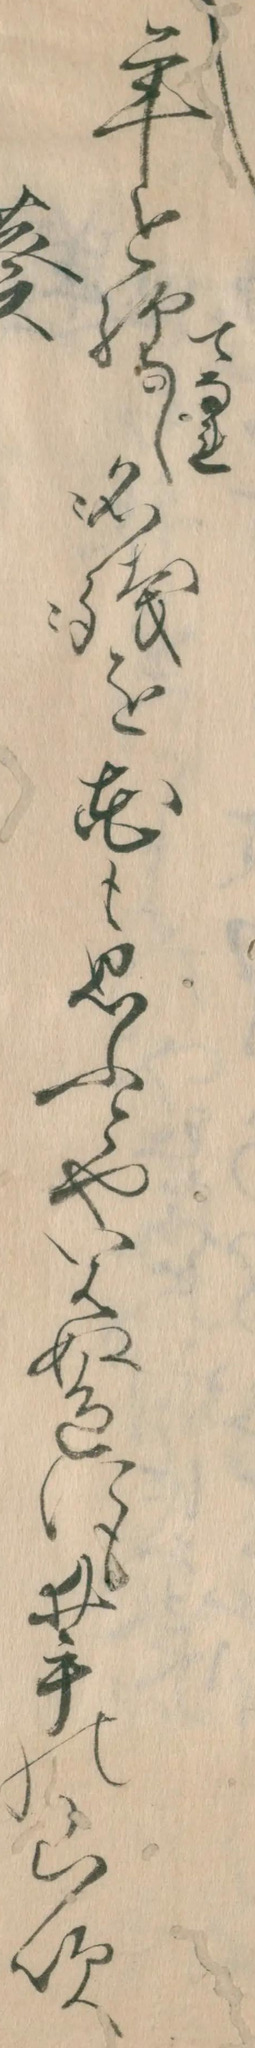〽年を経・し名残を花も思ふとやいはぬ色にものい吹

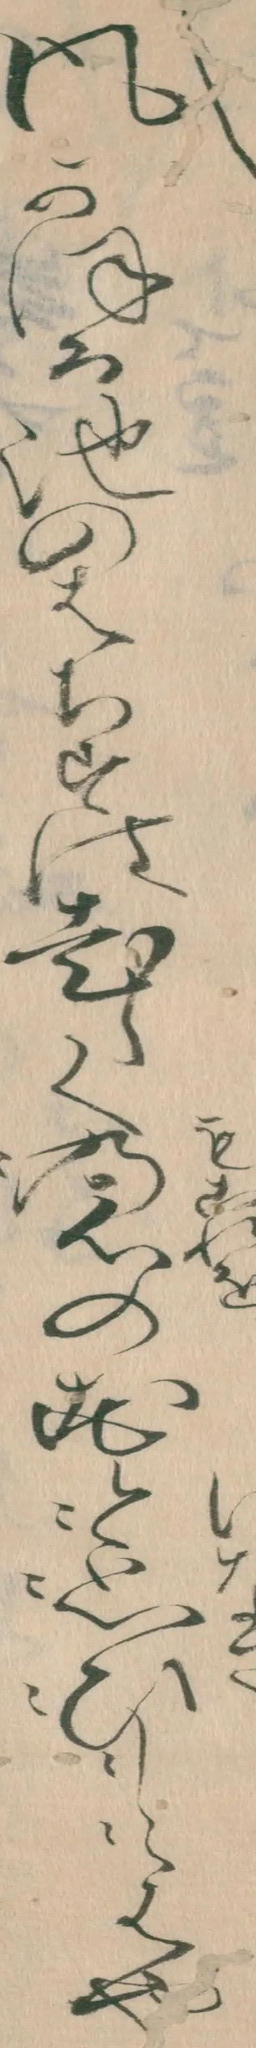〽風かほる池のはちすは老しく乃・心のととひになさりけはや
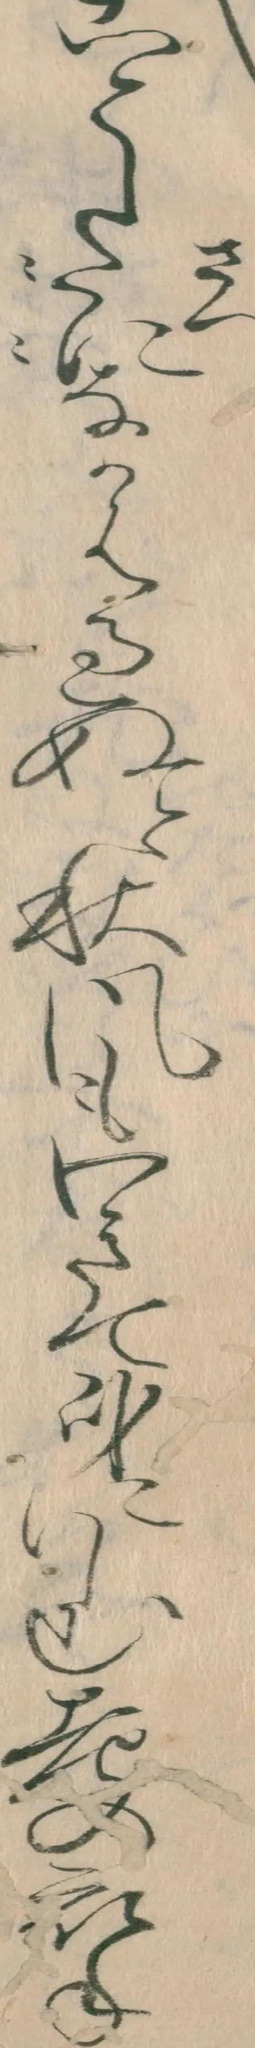〽ことしたにさへなかは過ぬと秋風もわきて身にしむ老の衣も

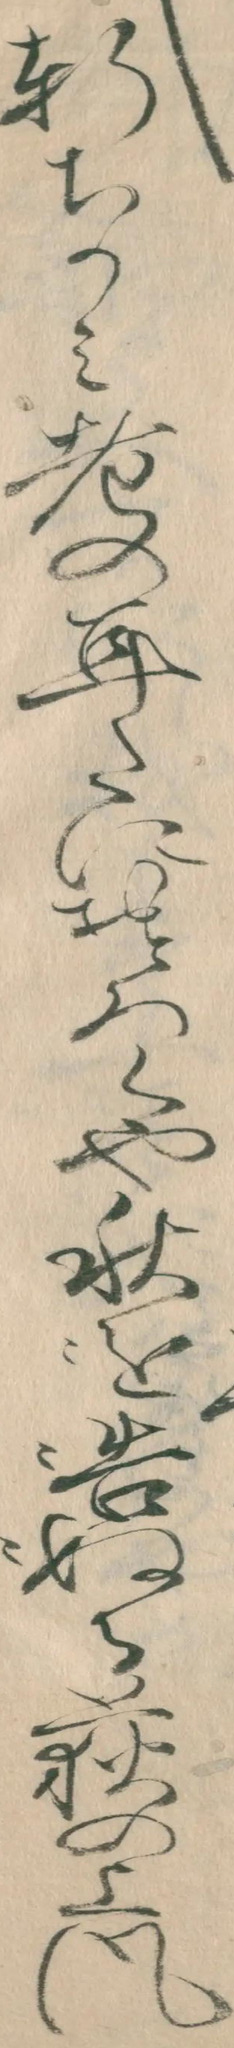〽軒ちかみ老の耳たにおゝつくや秋を告ぬさやかなる萩の上風
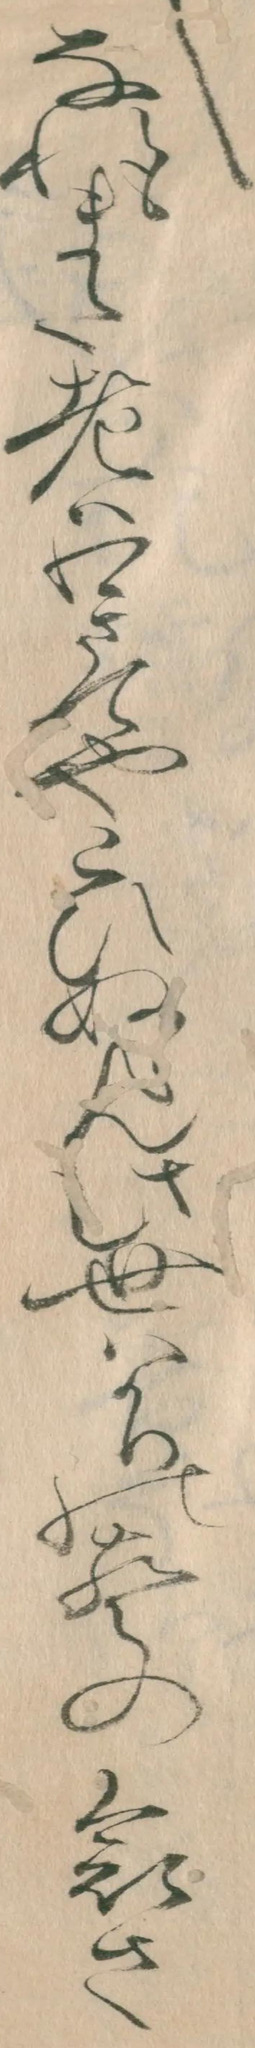〽なれときた老は口さてやらひぬこの世なかのその哀さ
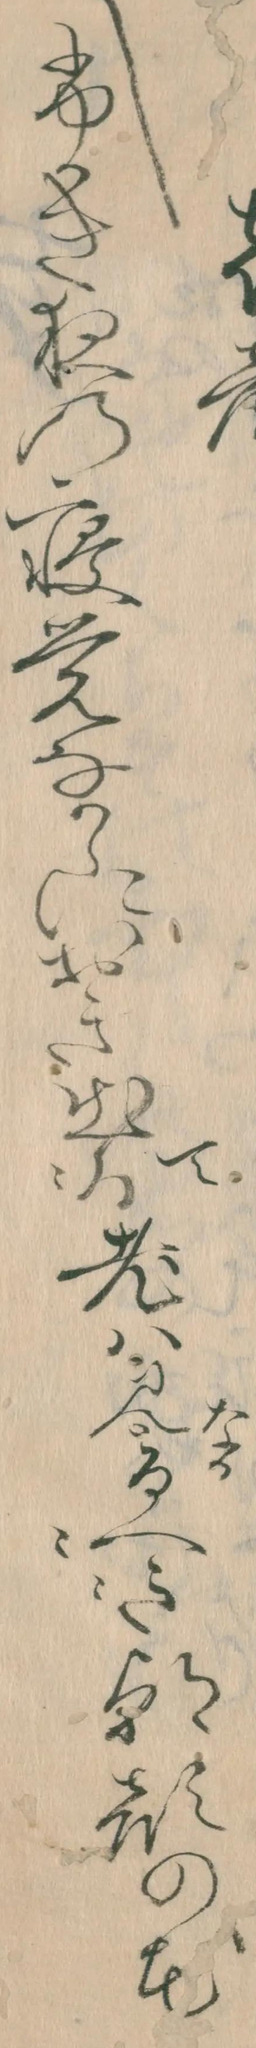〽かき夜の寝覚なかにおき出るて老は見・る朝顔の花
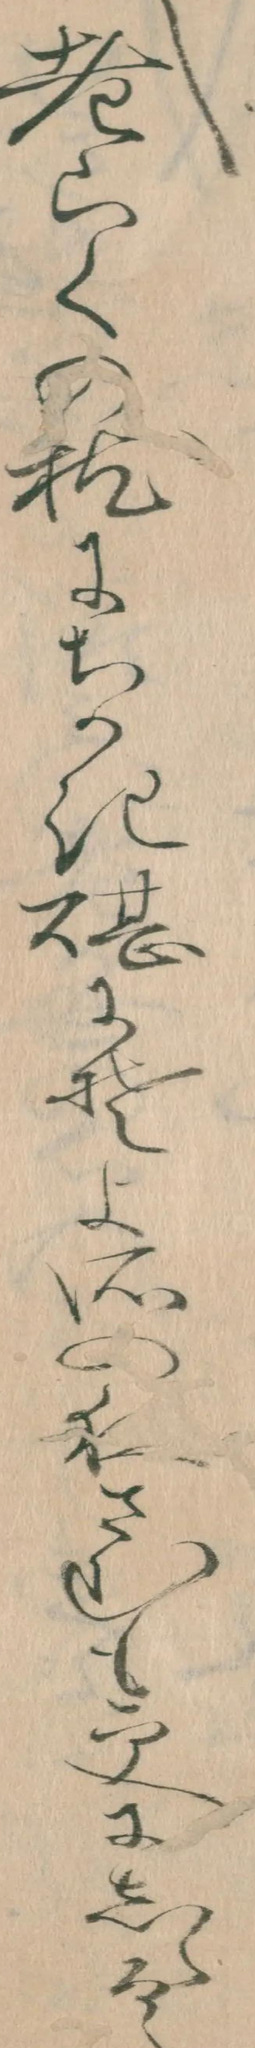〽老らくの枕にちかき砧にそよそのさむも更にしゝなく
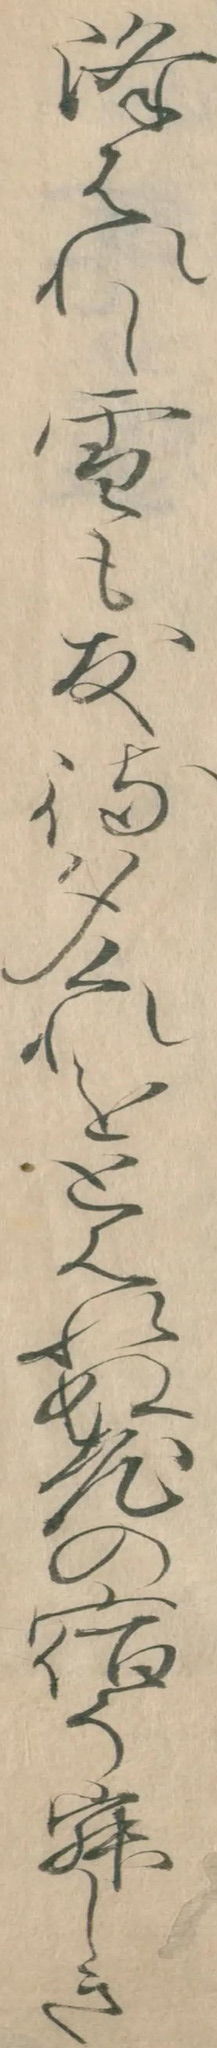〽降はれし雪も友待夕くれをとはれぬ老の宿の寂しき
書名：輪池叢書. 12
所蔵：国立国会図書館 National Diet Library, JAPAN
